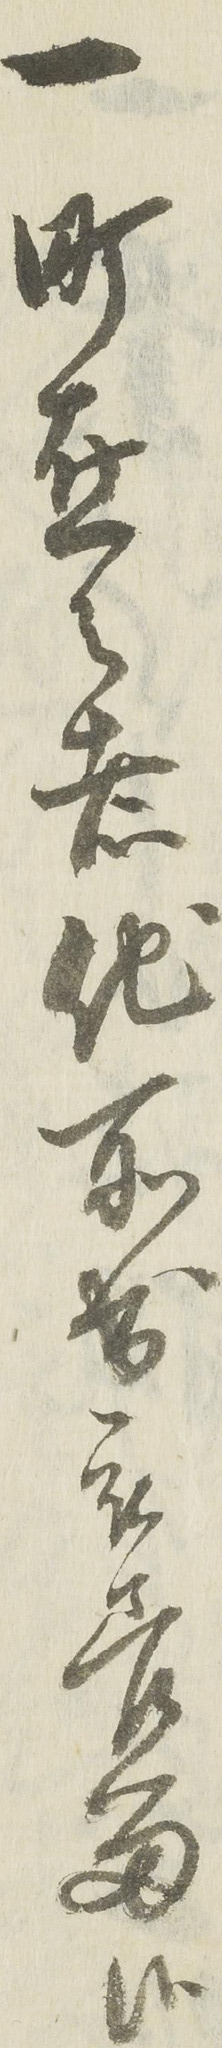一町在之者他所出被指留候
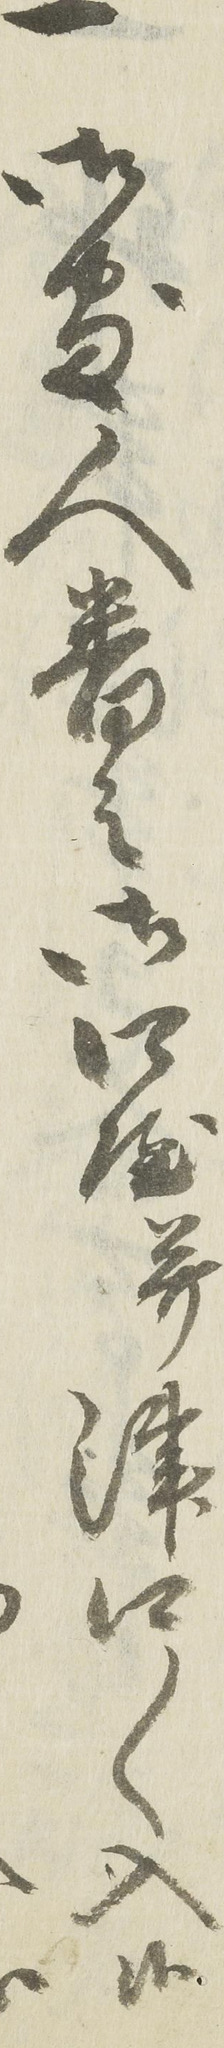一御家人番之御郷屋并津郷〳〵入候
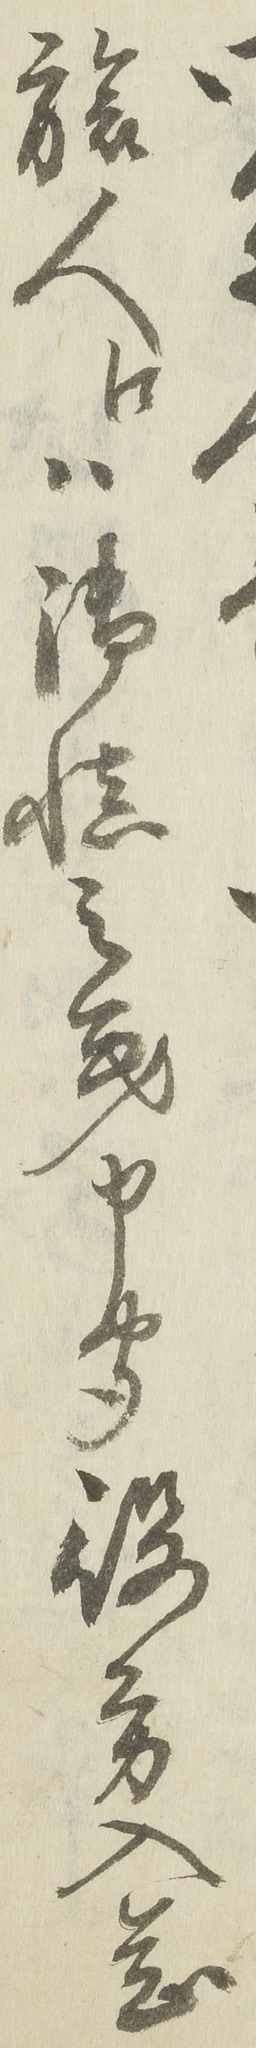旅人江は御慎之義申聞役方入念
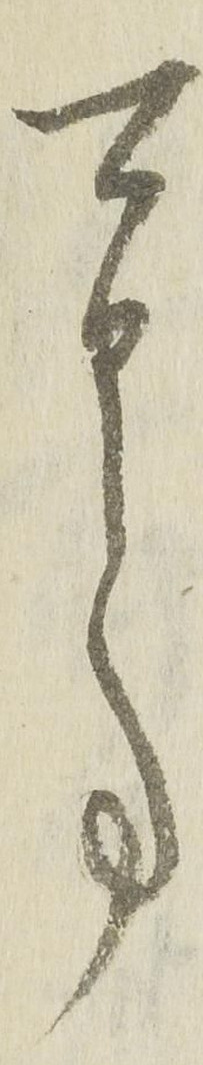可申事

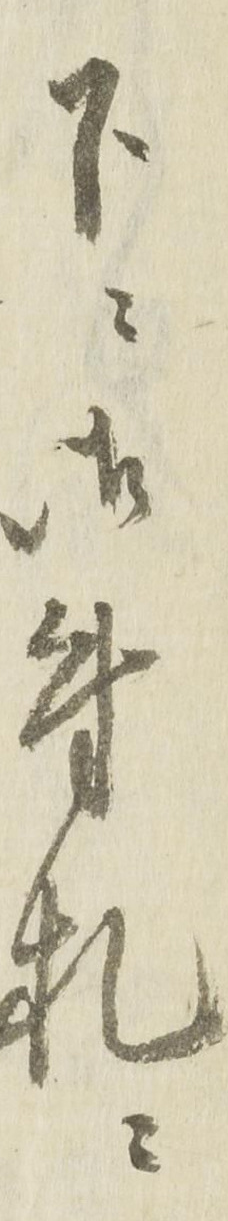下ニ御付札ニ
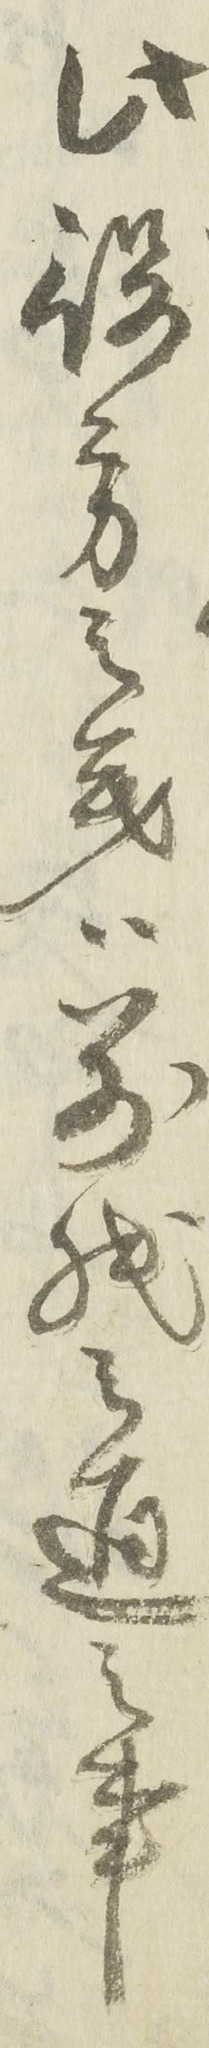此役方之義は別紙之通之事
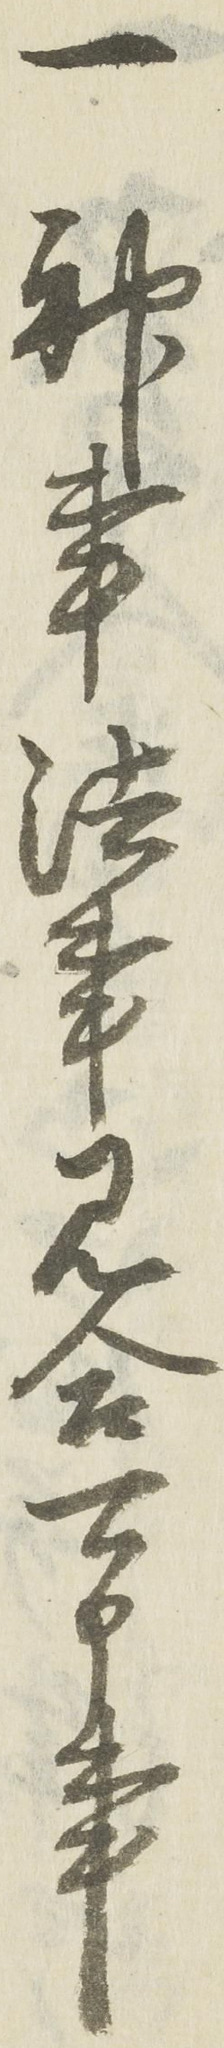一神事法事見合可申事
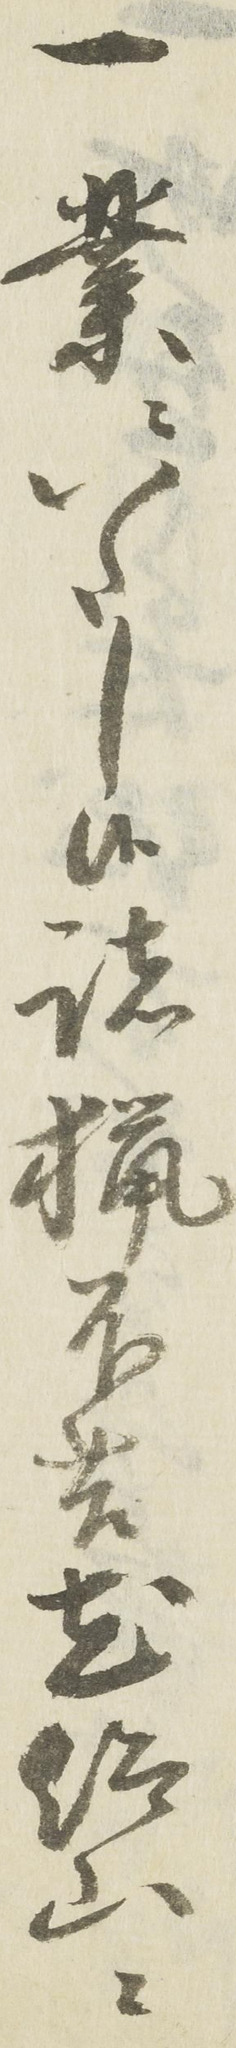一業ニいたし候諸猟不苦尤仰山ニ
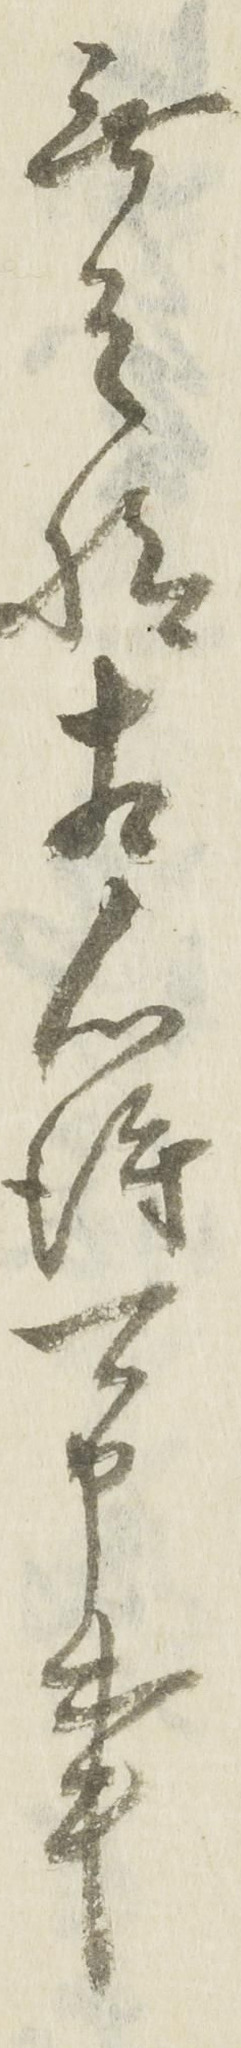無之様相心得可申事
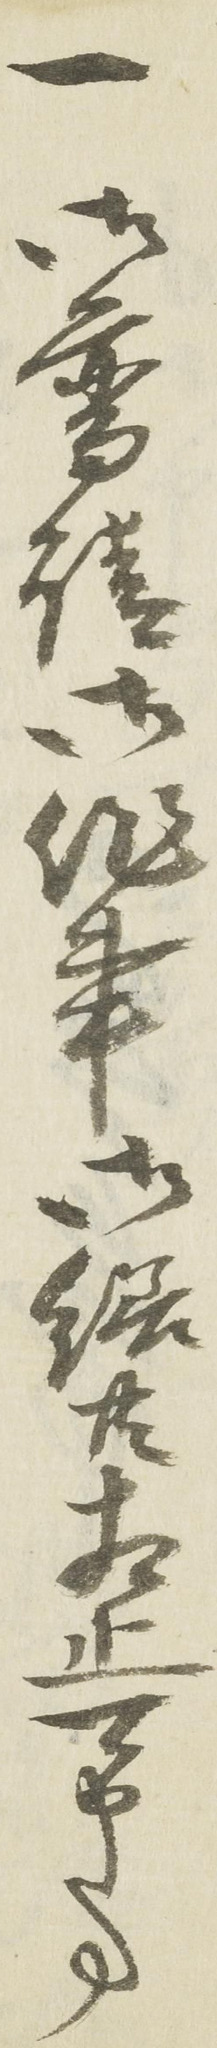一御普請御作事御繕共相止可申事
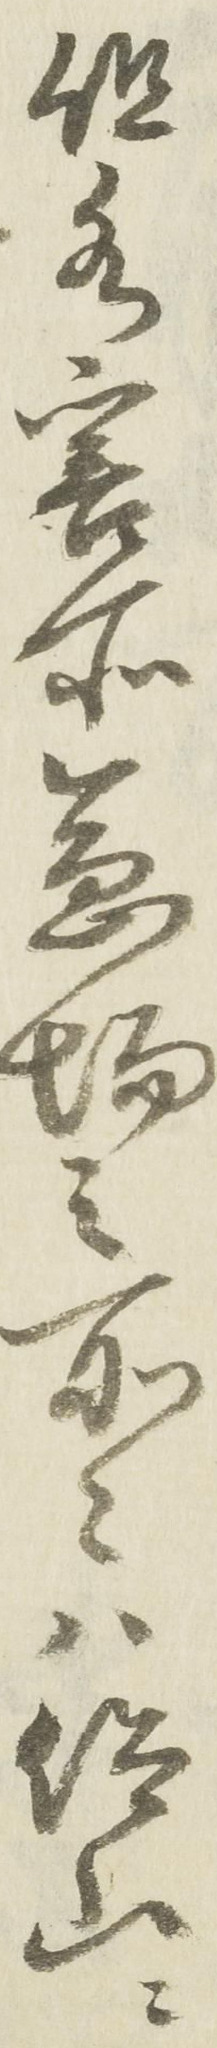但水害所急場之所々は仰山ニ
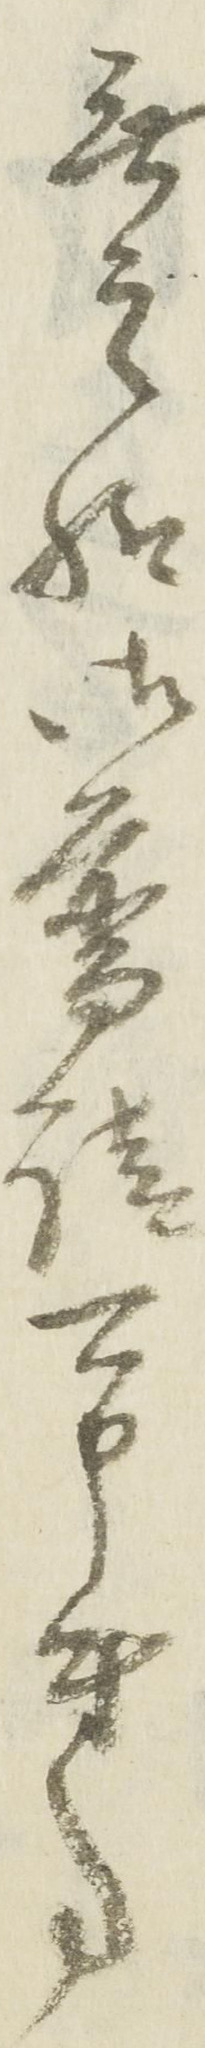無之様御普請可申付事
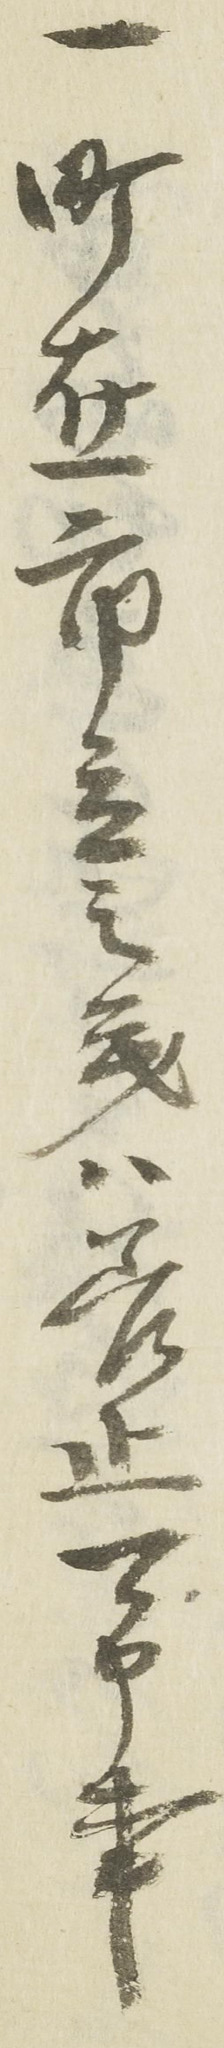一町在市立之義は差止可申事
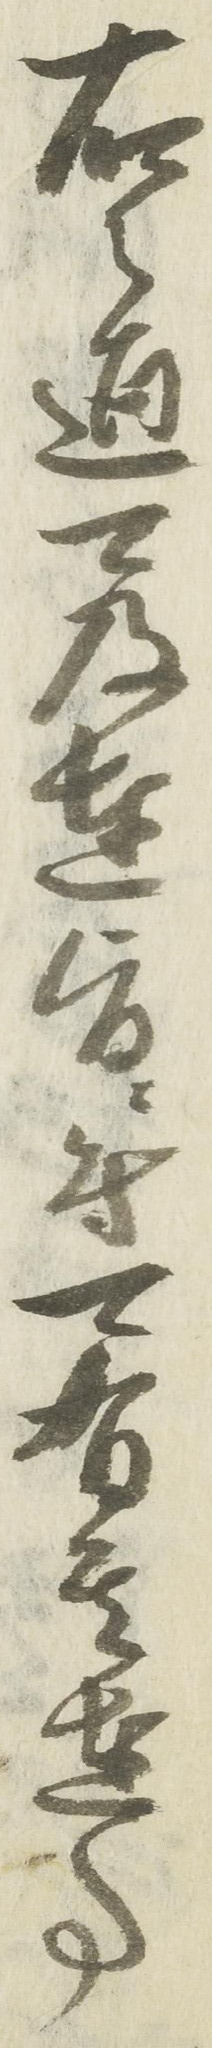右之通可及達旨ニ付可有其達事
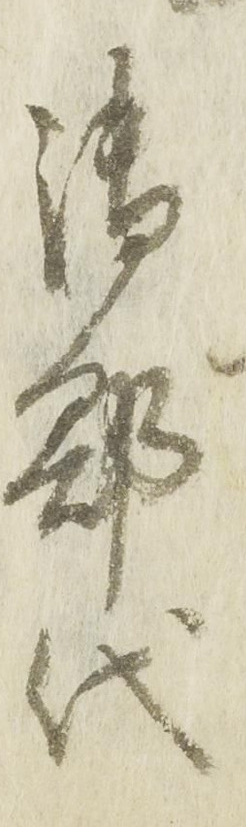御郡代
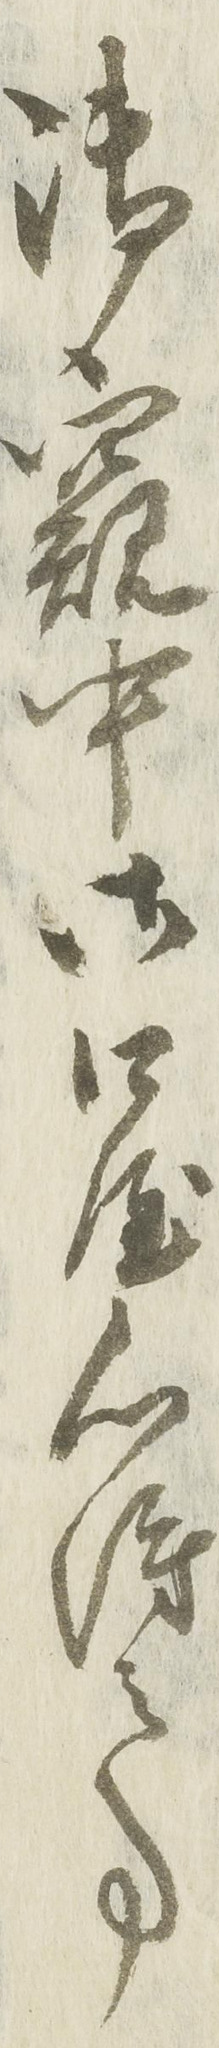御窺中御郷屋心得之事
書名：後見笑
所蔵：東京大学地震研究所図書室 Earthquake Research Institute Library, The University of Tokyo, JAPAN
